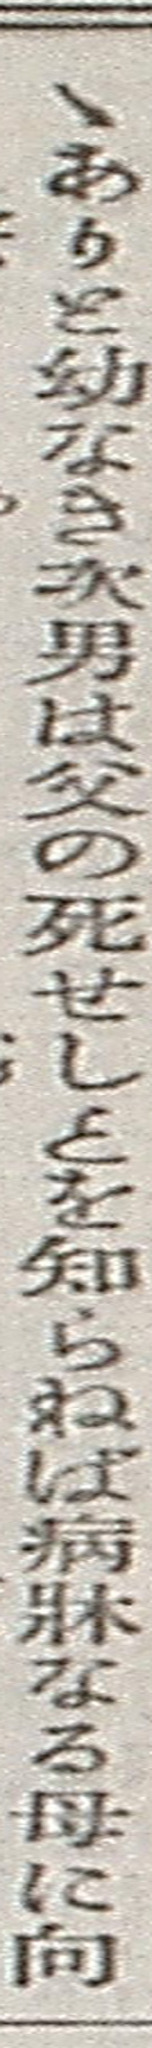ゝありと幼なき次男は父の死せしことを知らねば病牀なる母に向
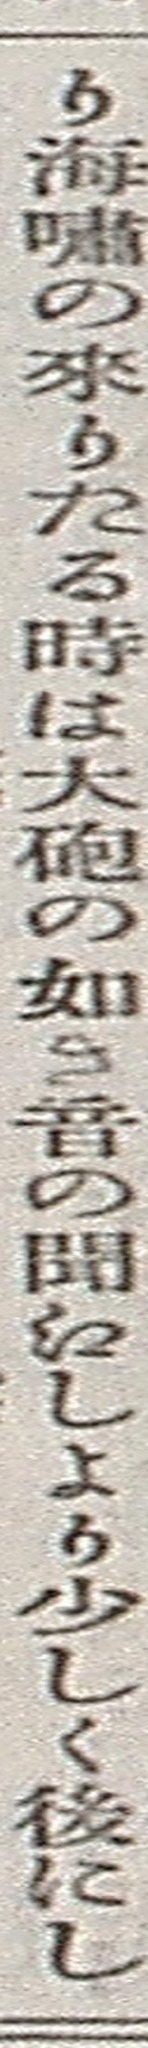り海嘯の来りたる時は大砲の如き音の聞えしより少しく後にし
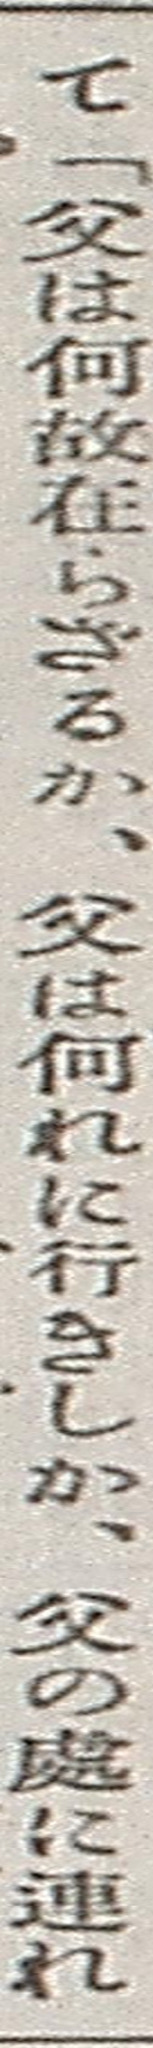て「父は何故在らざるか、父は何れに行きしか、父の処に連れ
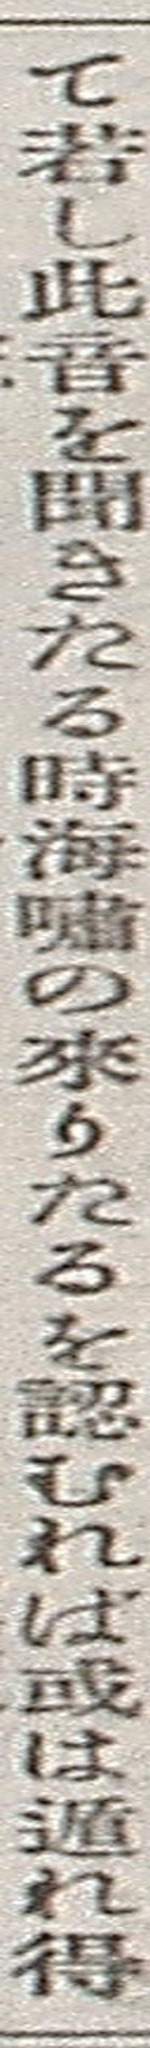て若し此音を聞きたる時海嘯の来りたるを認むれば或は遁れ得
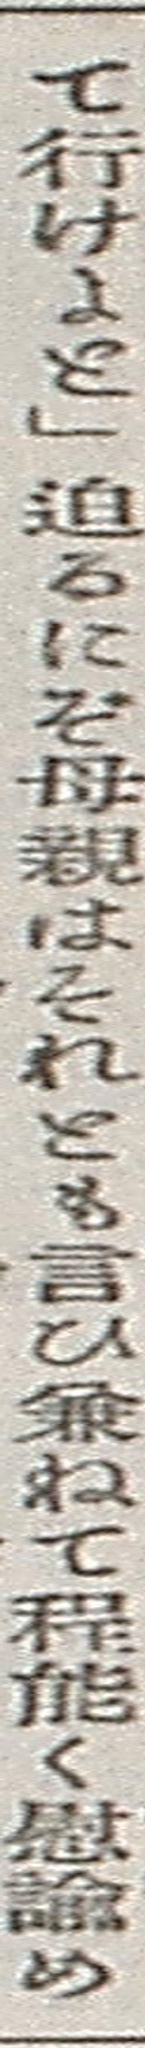て行けよと」迫るにぞ母親はそれとも言ひ兼ねて程能く慰論め
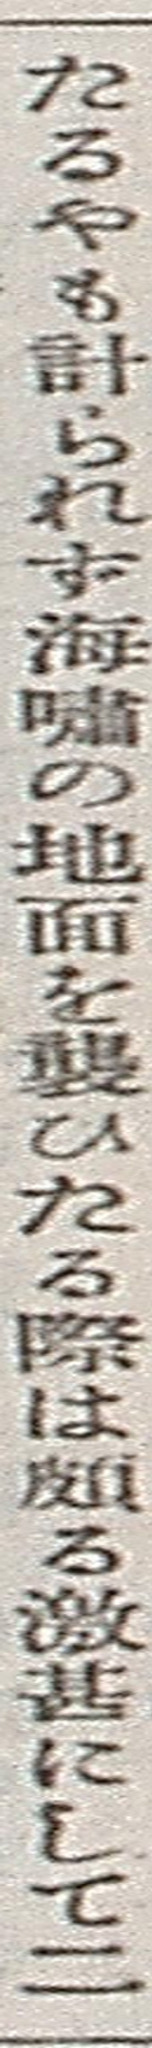たるやも計られず海嘯の地面を襲ひたる際は頗る激甚にして二
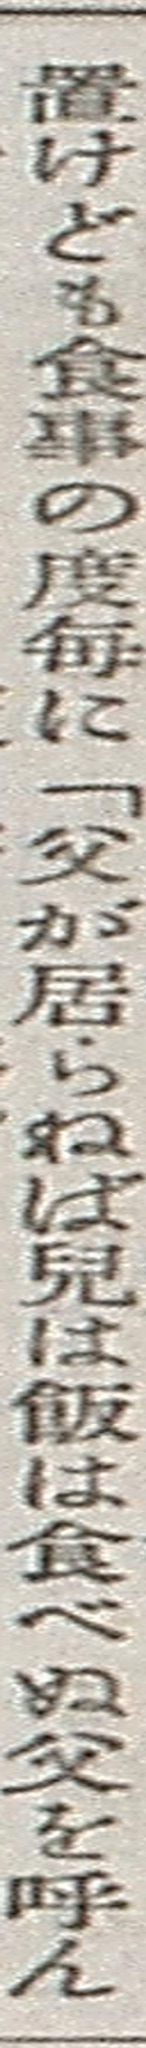置けども食事の度毎に「父が居らねば兒は飯は食べぬ父を呼ん
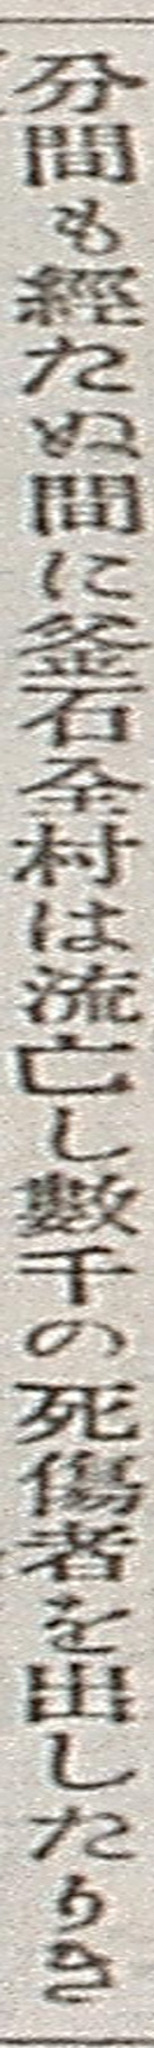分間も経たぬ間に釜石全村は流亡し数千の死傷者を出したりき
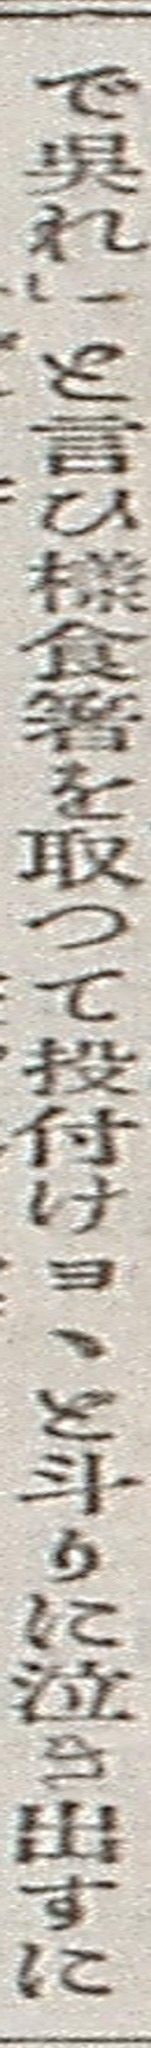で呉れ」と言ひ様食箸を取つて投付けヨヽと斗りに泣き出すに
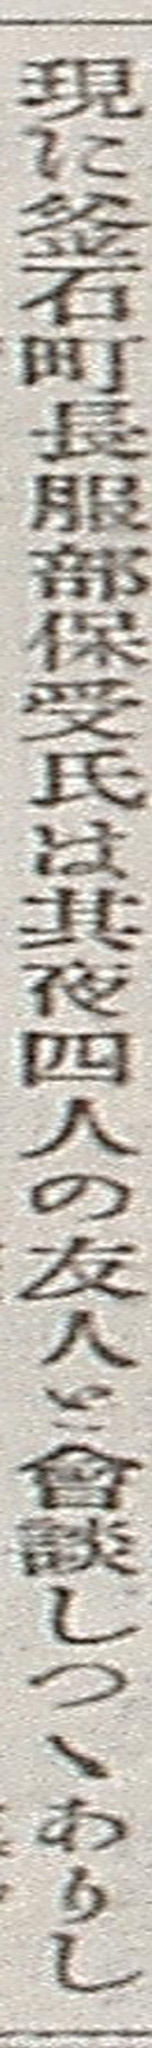現に釜石町長服部保受氏は其夜四人の友人と会談しつゝありし
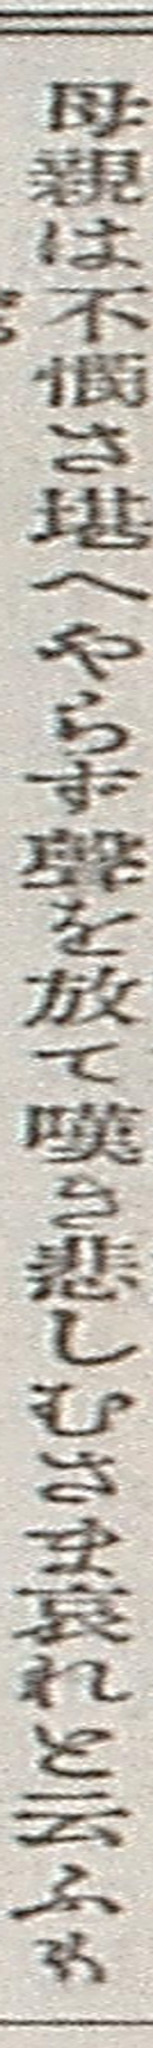母親は不憫さ堪へやらず声を放て嘆き悲しむさま哀れと云ふも
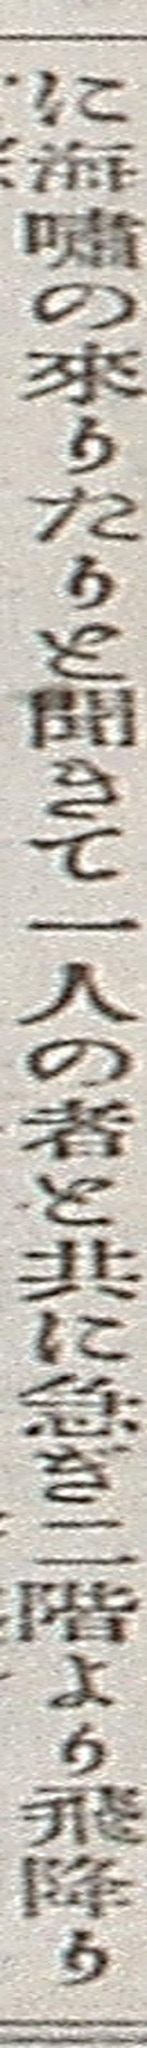に海嘯の来りたりと聞きて一人の者と共に急ぎ二階より飛降り
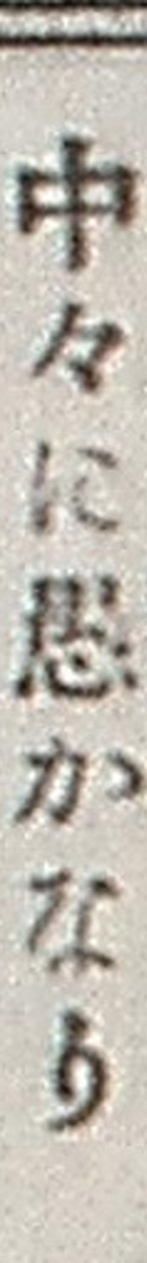中々に愚かなり
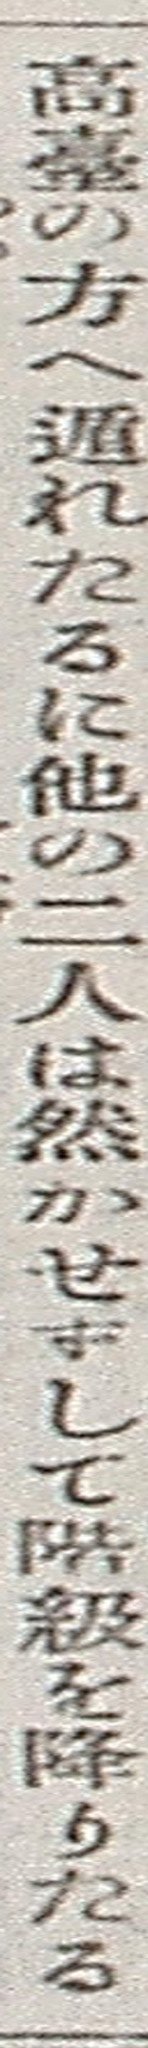高台の方へ遁れたるに他の二人は然かせずして階級を降りたる
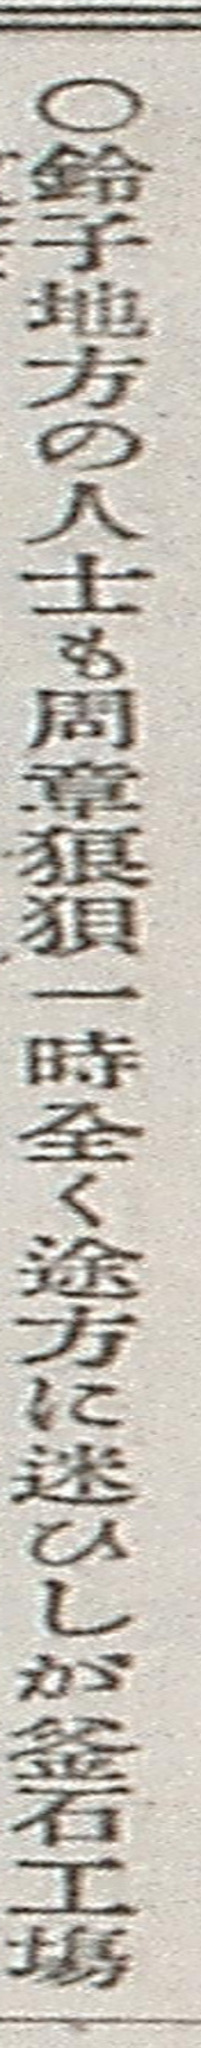○鈴子地方の人士も周章狼狽一時全く途方に迷ひしが釜石工場
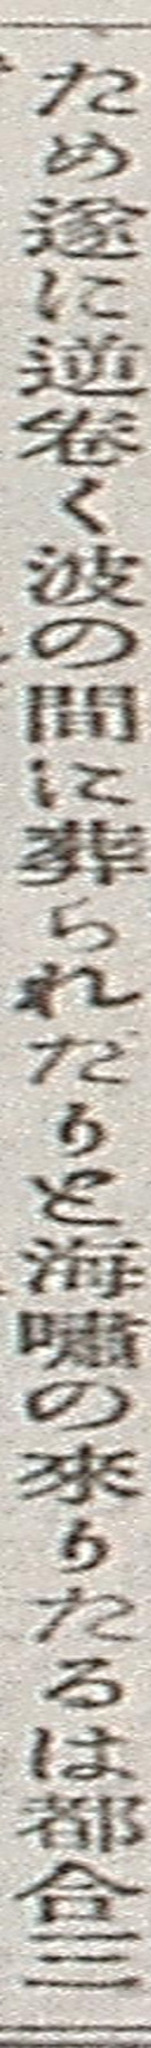ため遂に逆巻く波の間に葬られたりと海嘯の来りたるは都合三
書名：風俗畫報臨時増刊第百二十號　大海嘯被害録（下）
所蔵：東京大学地震研究所図書室 Earthquake Research Institute Library, The University of Tokyo, JAPAN
